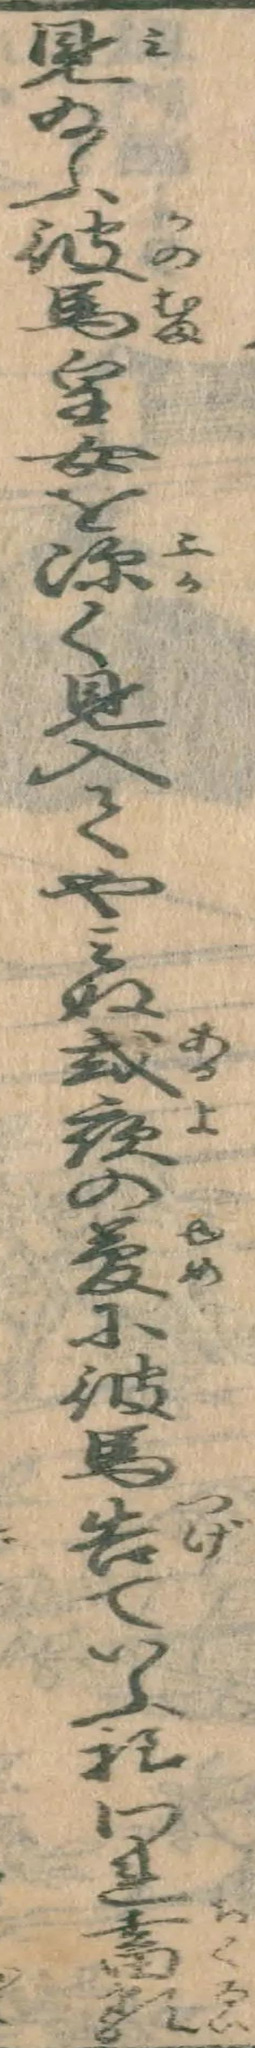見給ふ彼馬皇女を深く見入てやみぬ或夜の夢に彼馬告ていふ様われ畜類
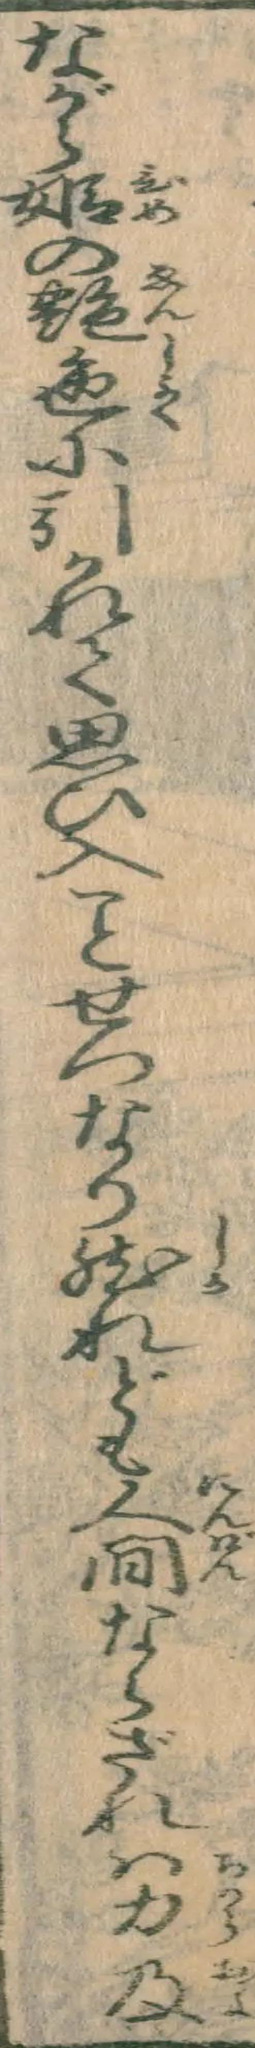ながら姫の艶色に引かれて思ひ入ることせつなり然れども人間ならざれはカ及
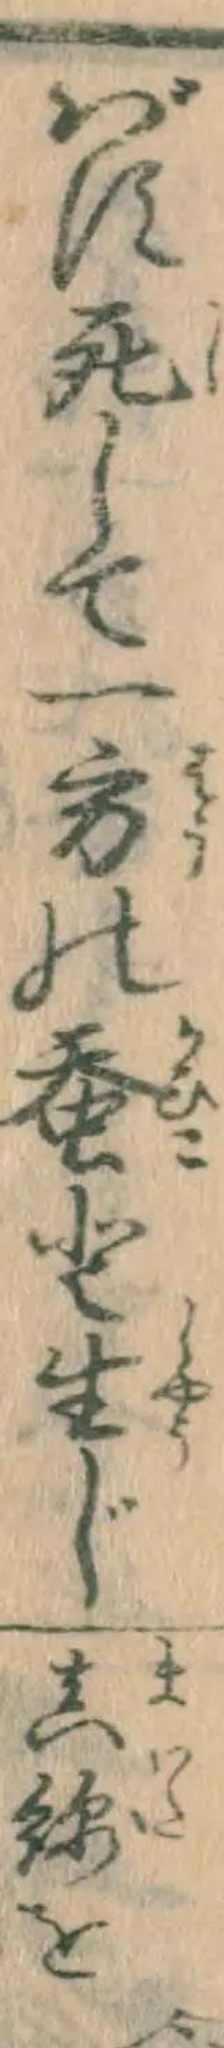ばす死して一方の蚕と生じ
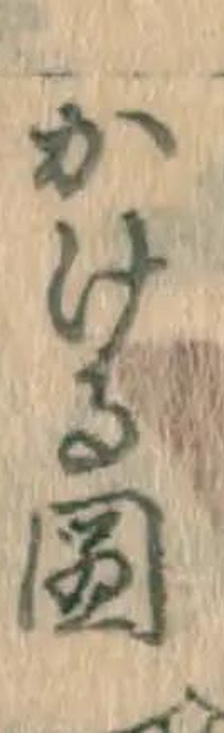かける図
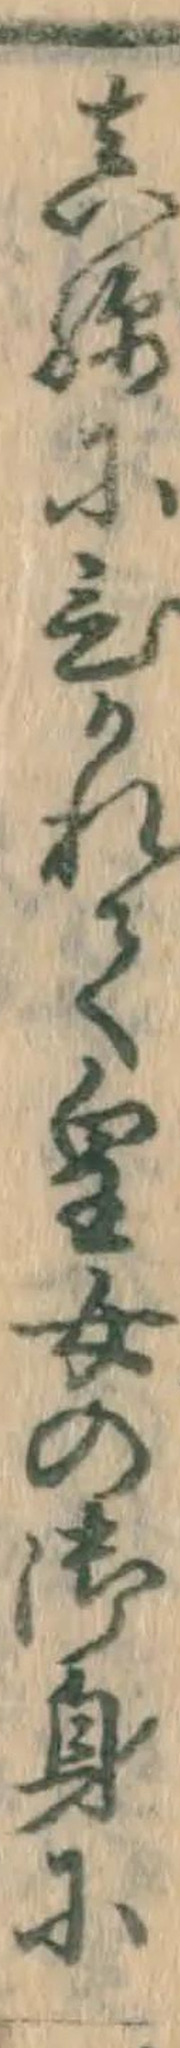真綿にひかれて皇女の御身（
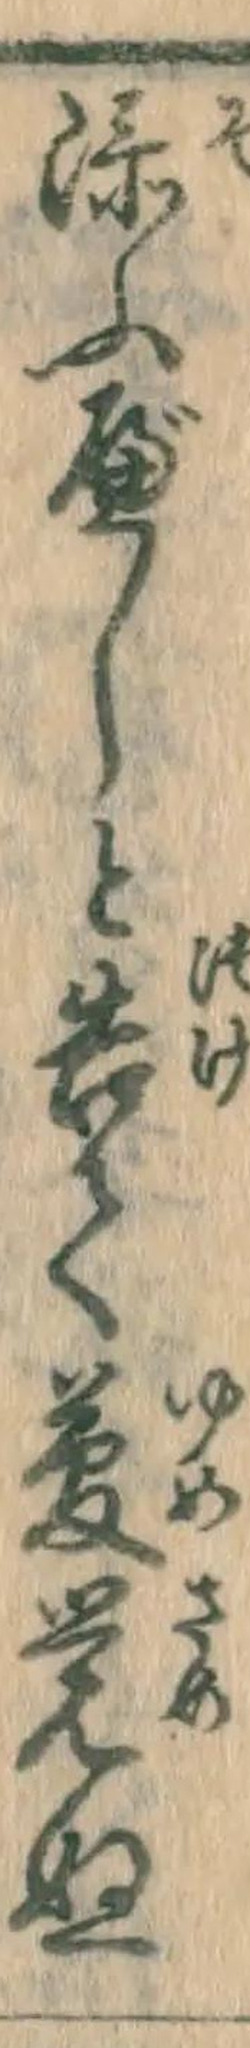添ふべしと告て夢覚ぬ
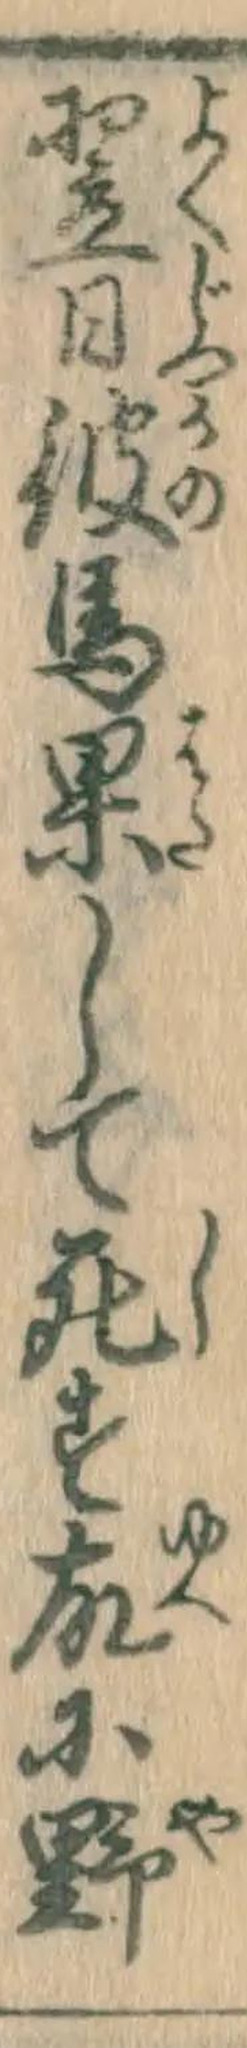翌日彼馬果して死す故に野
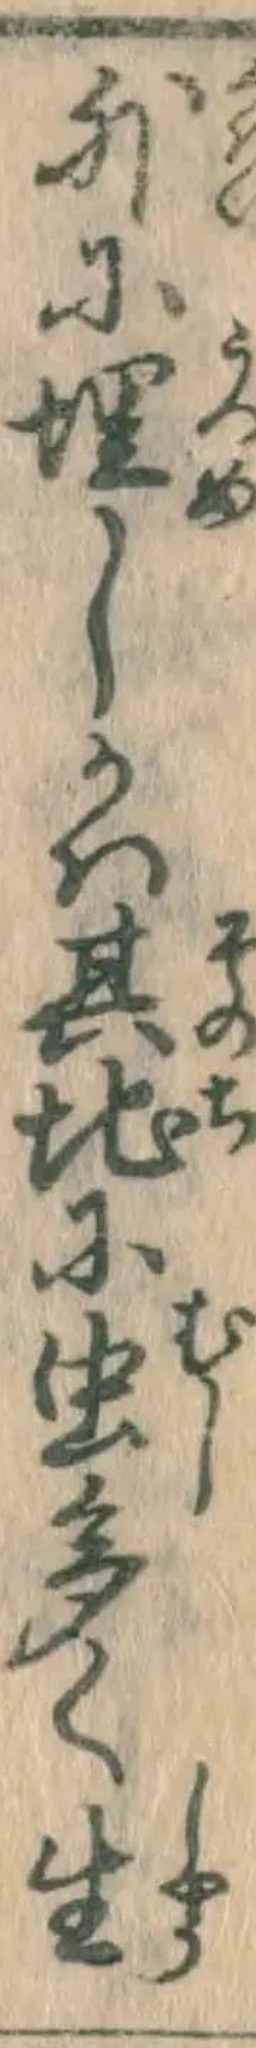外に埋しかは其地に虫多く生
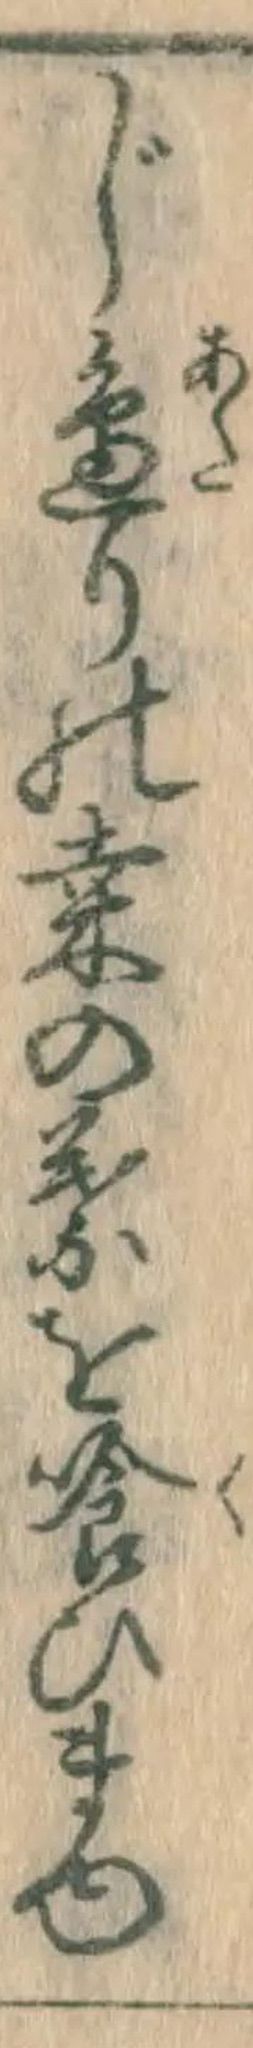じ辺りの桑の葉を喰ひまゆ
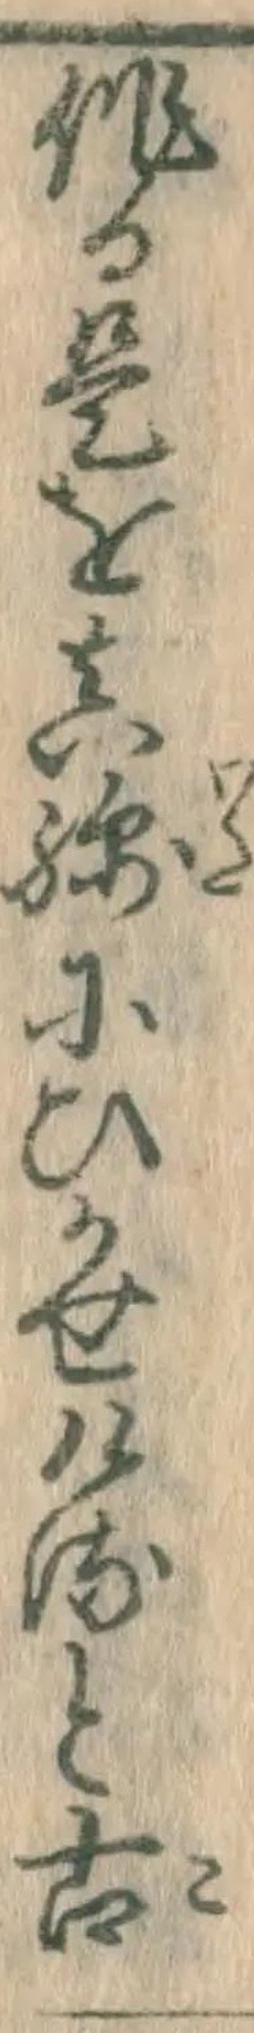作る是を真綿にひかせけると古
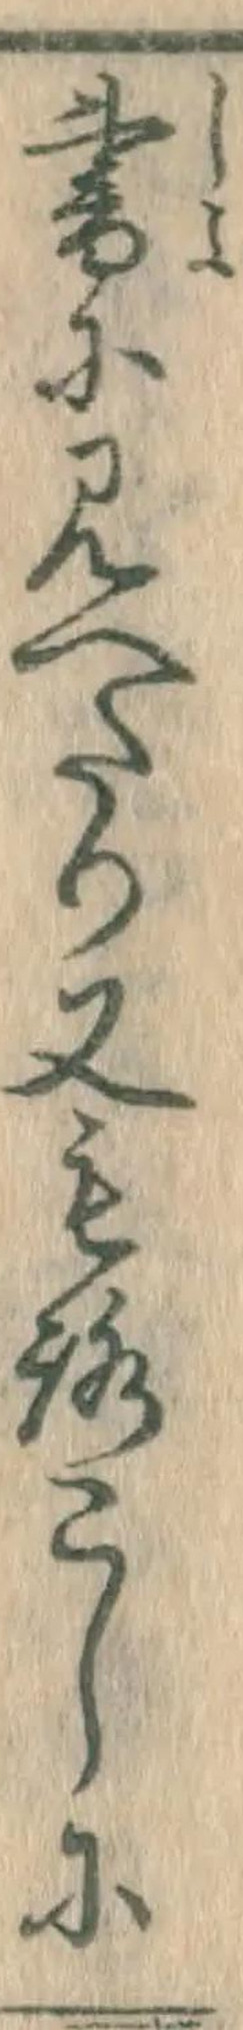書に見へたり又もろこしに
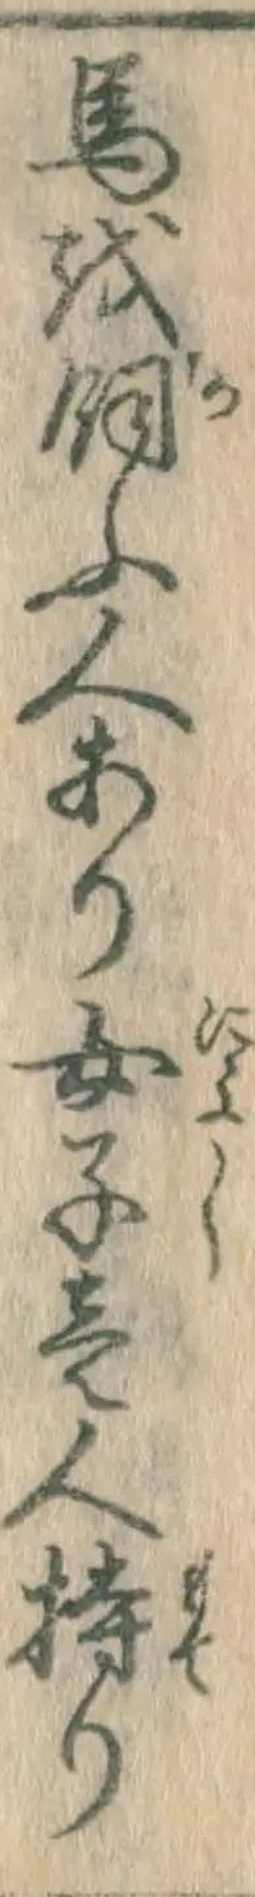馬を飼ふ人あり女子壱人持り
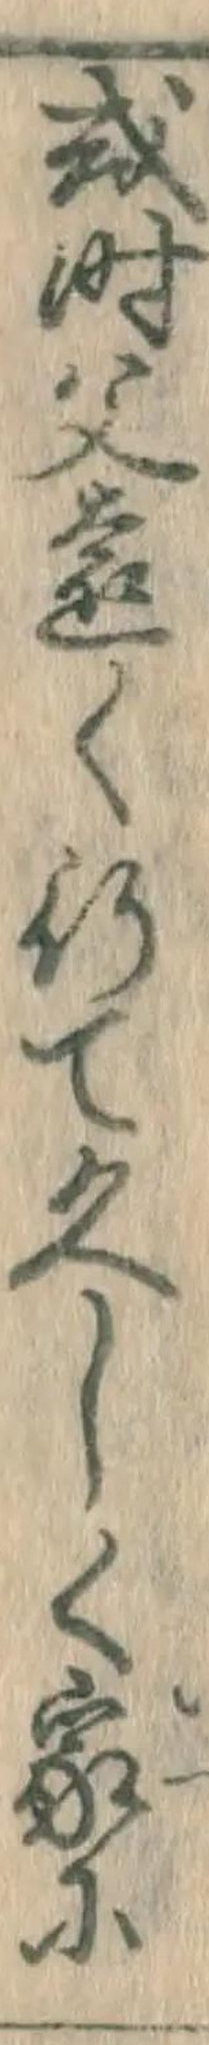或時父遠く行て久しく家に
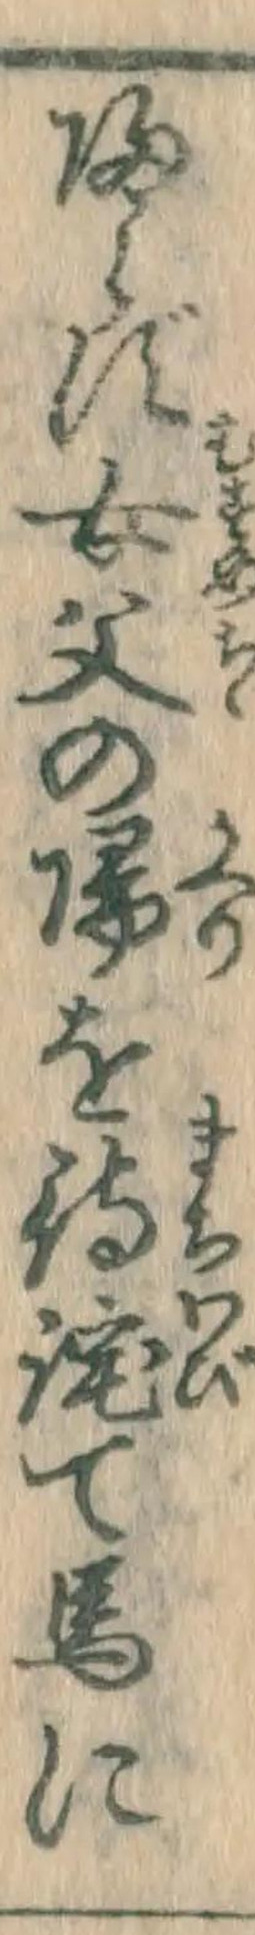帰らず女父の帰を待詫て馬に

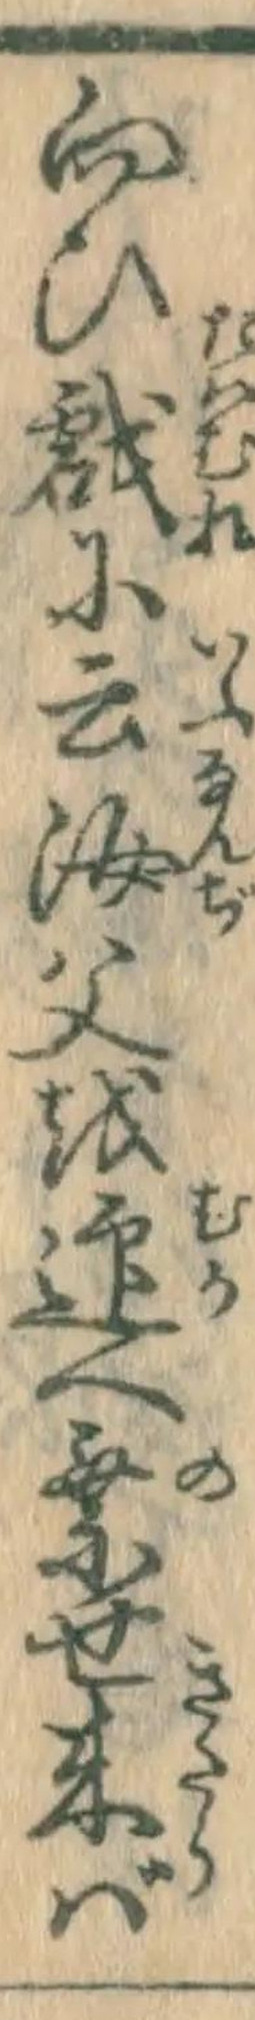向ひ戯に云汝父を迎へ乗せ来ば
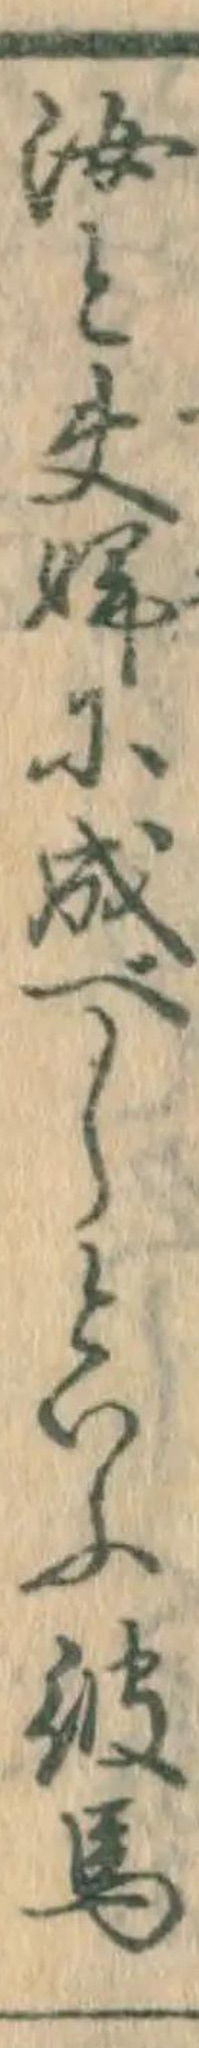汝と夫婦に成べしといふ彼馬
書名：養蚕秘録 3巻. [3]
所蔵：国立国会図書館 National Diet Library, JAPAN
